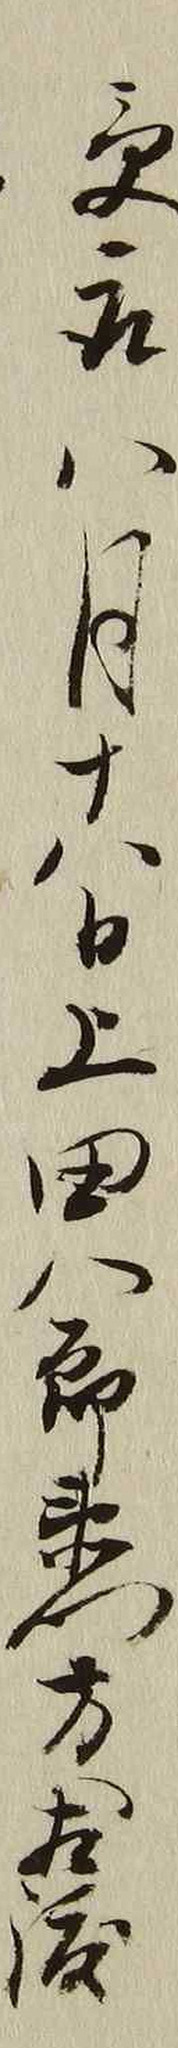受取八月十八日上田八郎衛門方へ相渡
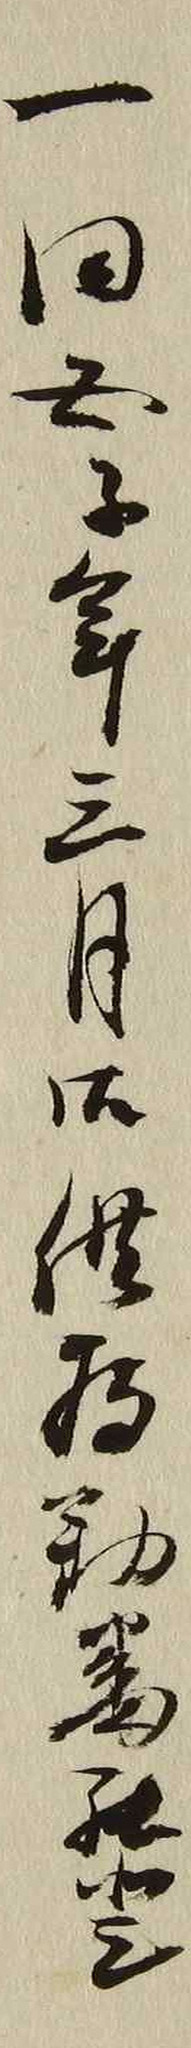一同五子年三月御供為勤番罷登
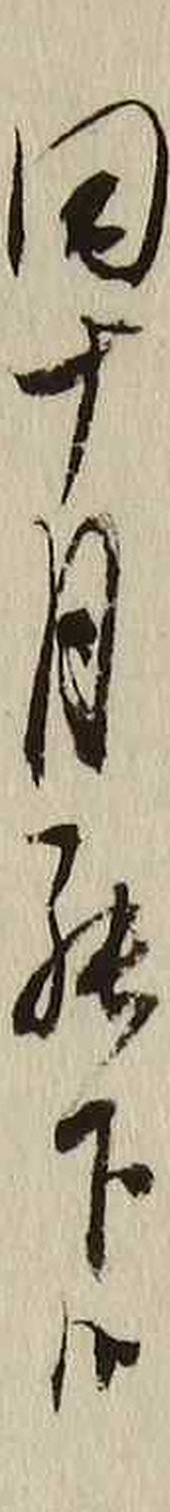同十月罷下候
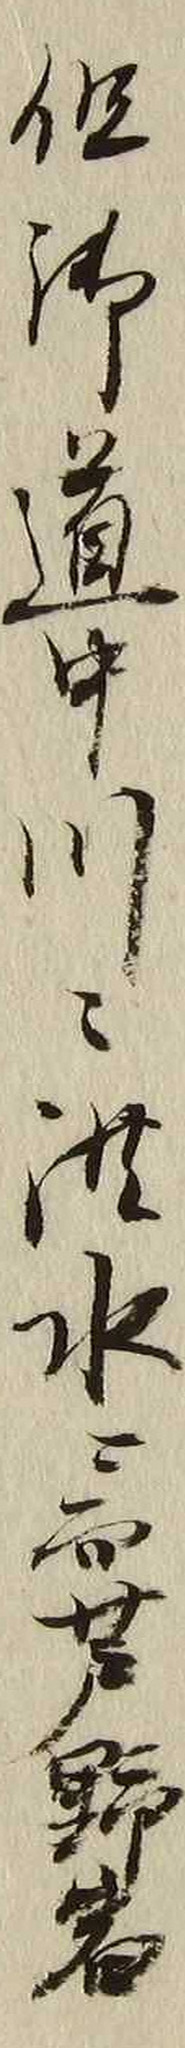但御道中川々洪水ニ而芦野宿
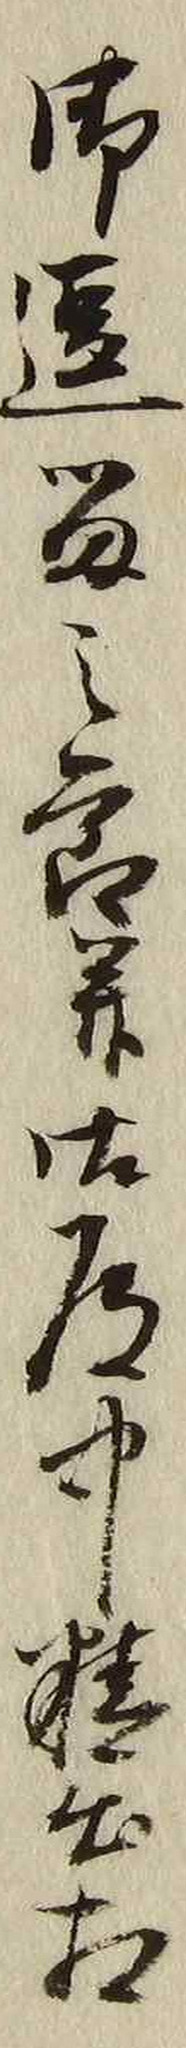御逗留之節并御道中精出相
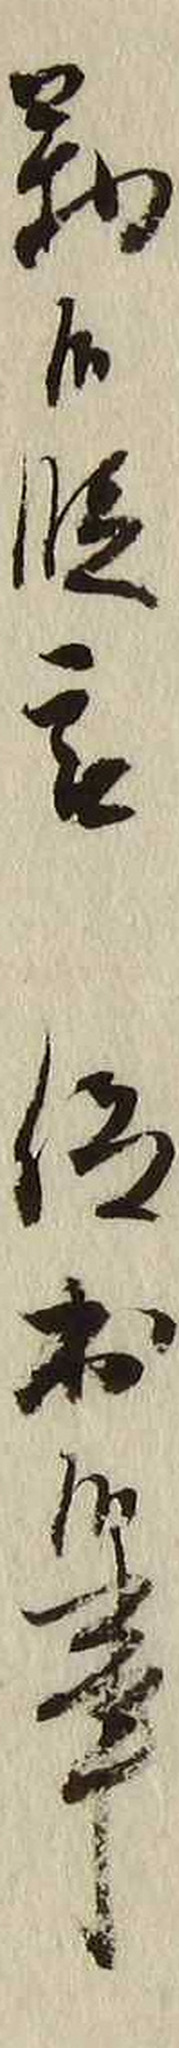勤候段被仰出候事
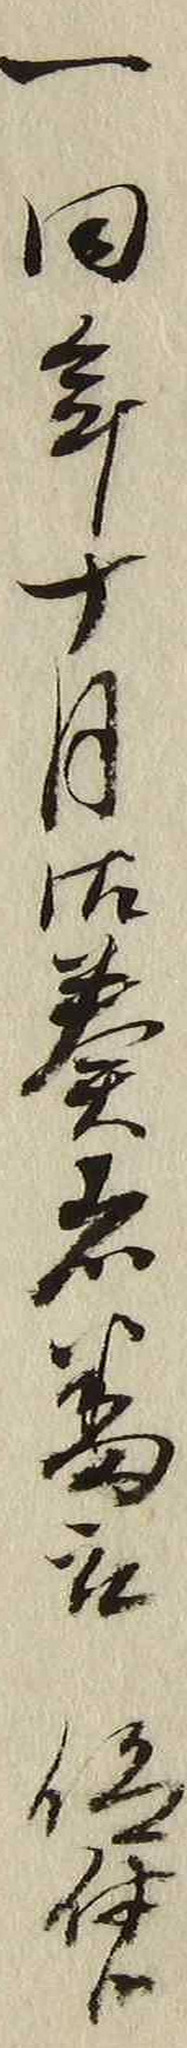一同年十月御奏者番被仰付候
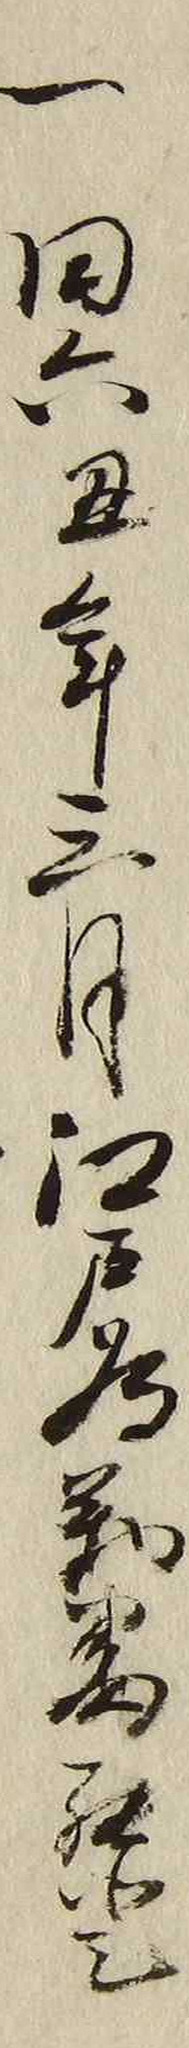一同六丑年三月江戸為勤番罷登
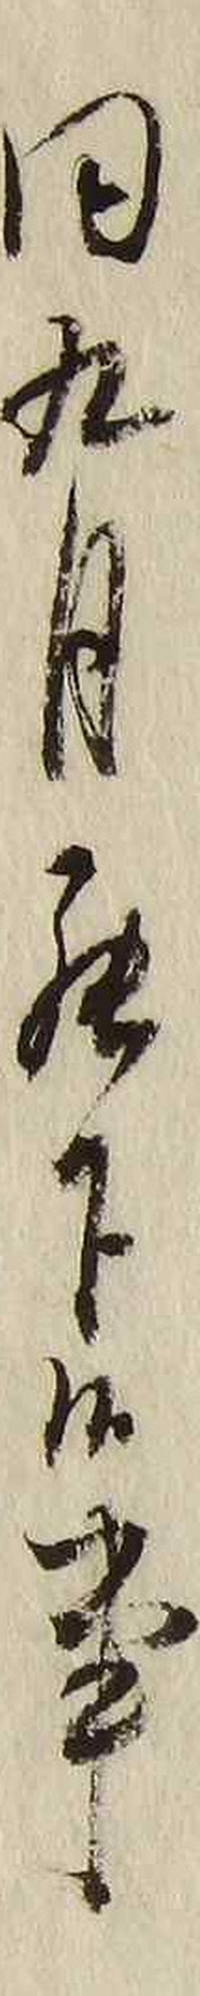同九月罷下候事
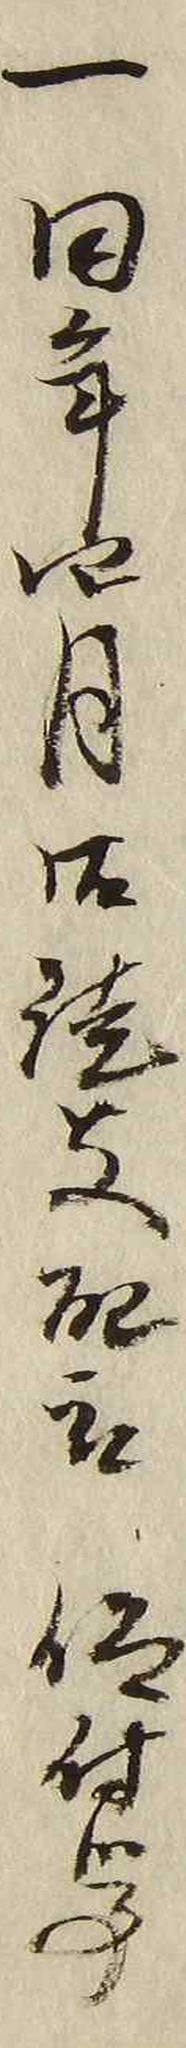一同年四月御徒支配被仰付候事
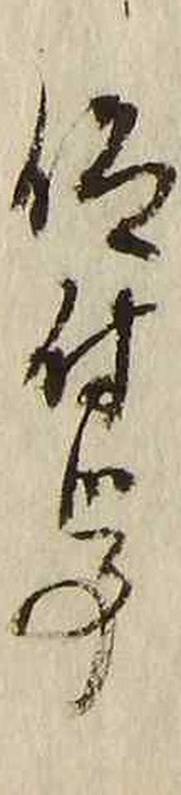仰出候事

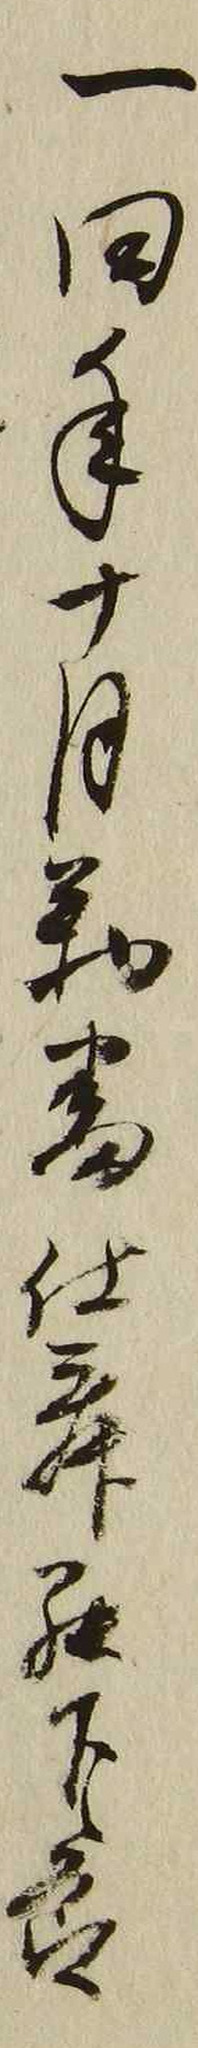一同年十月勤番仕舞罷下候節
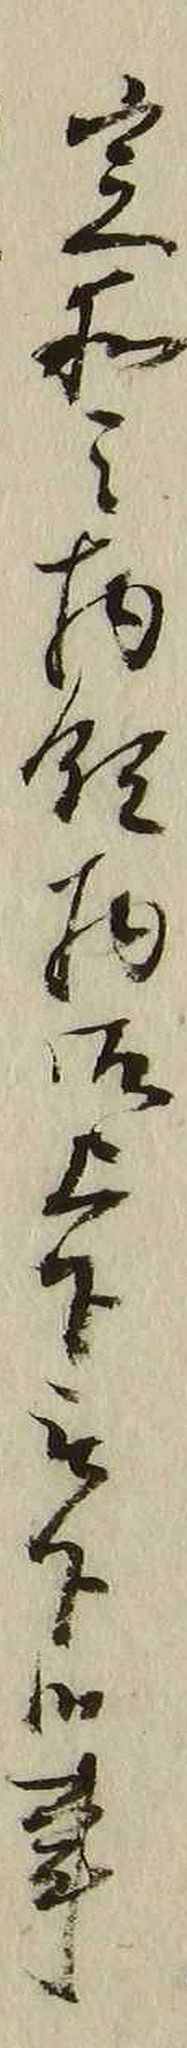定和之拝領物御上下被下候事
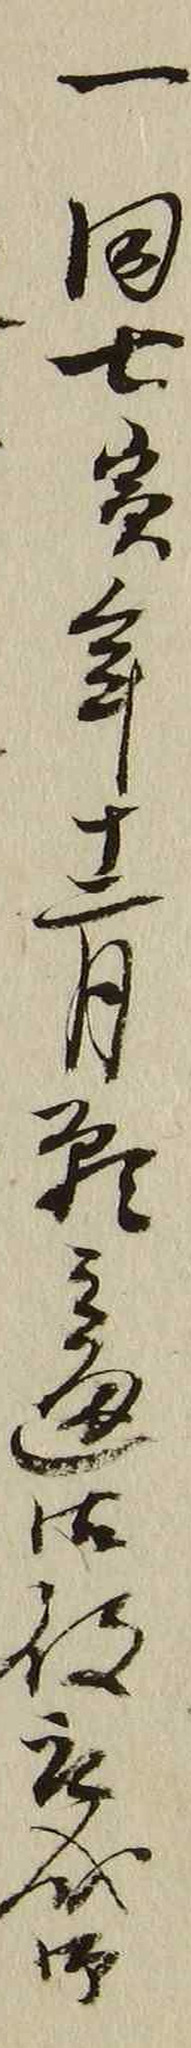一同七寅年十二月願之通御役被成御
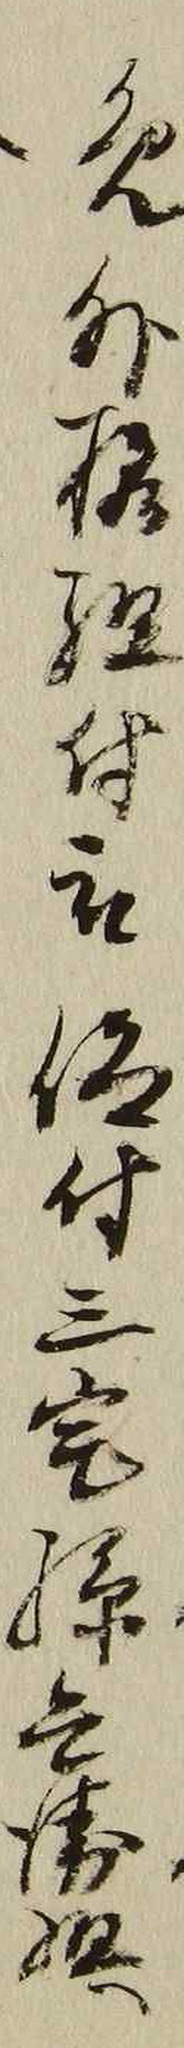免外様組付被仰付三宅孫兵衛組へ
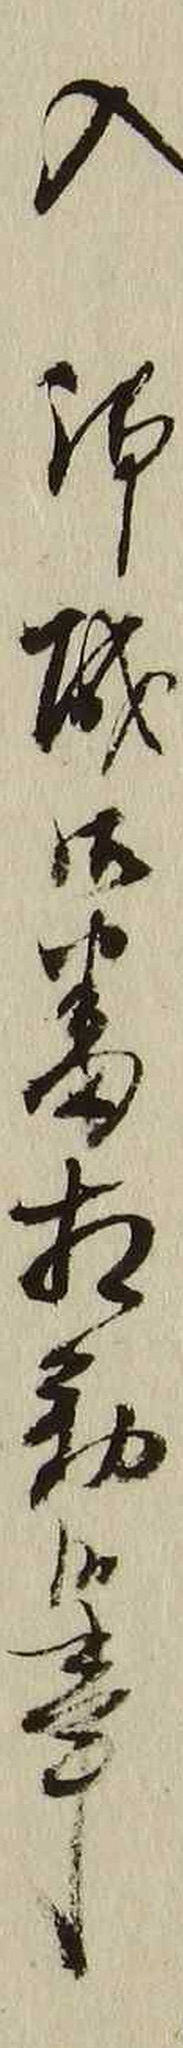入御城御番相勤候事
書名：諸士系譜　巻之349　も之部5
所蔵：会津若松市立会津図書館
